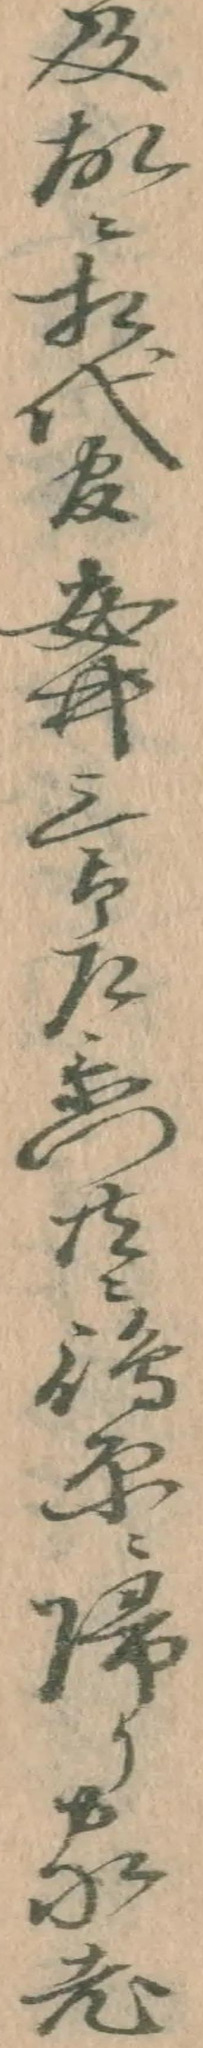及故に相代官安井三郎左衛門共に島原に帰り家老
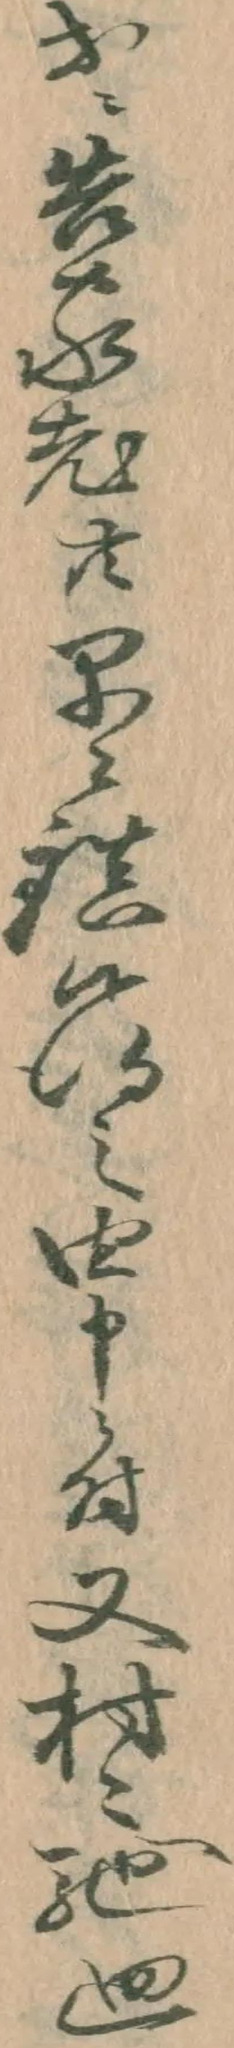方に告家老共早々鎮候得之由申に付又村々へ馳廻
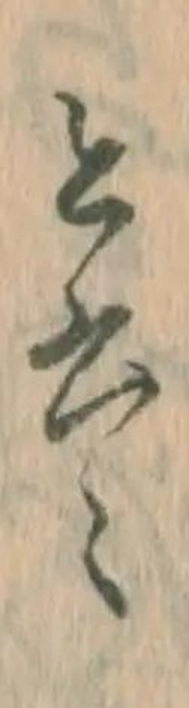と云々
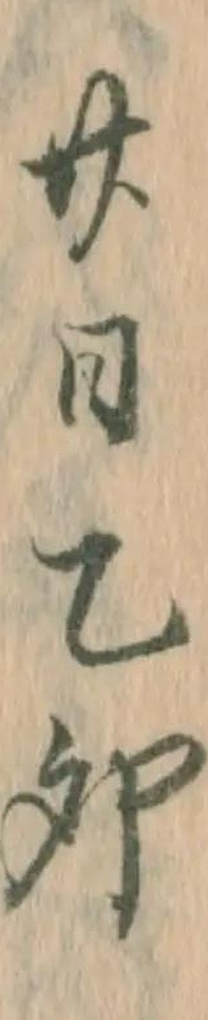廿日乙卯
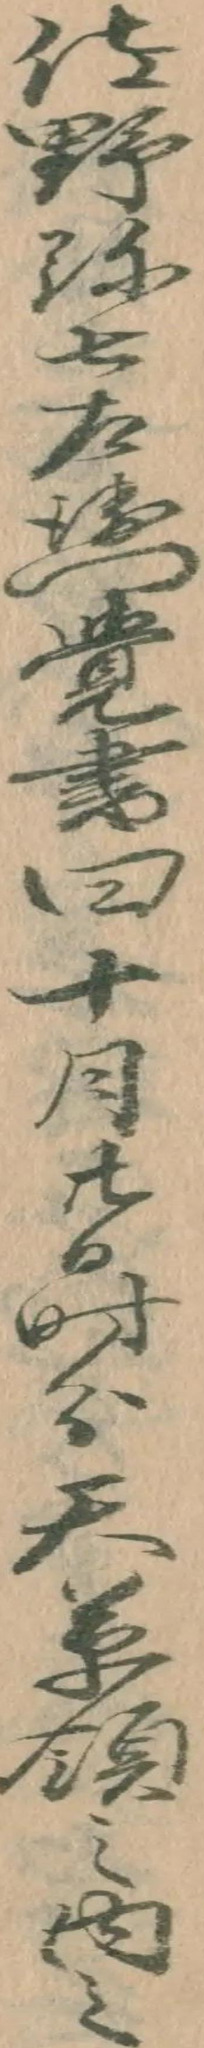佐野弥七左衛門覚書日十月廿日時分天草領之内之
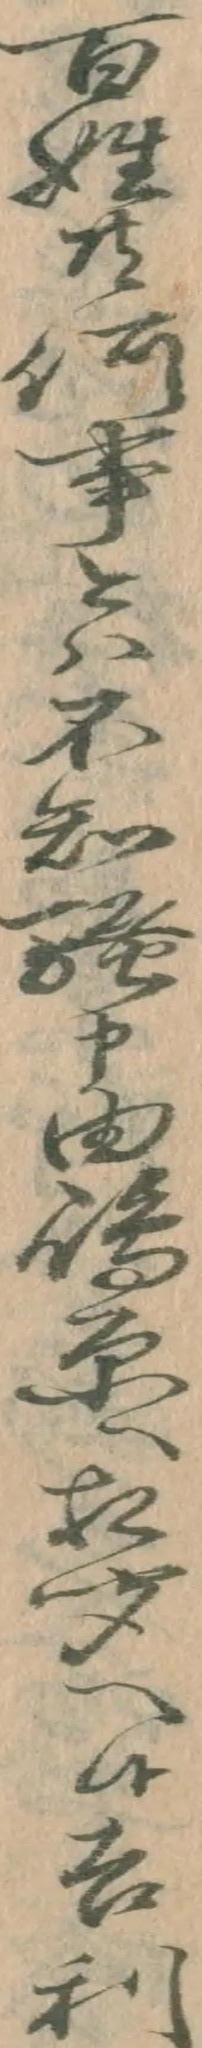百姓共何事とは不知騒申由島原へ相聞へ候吉利
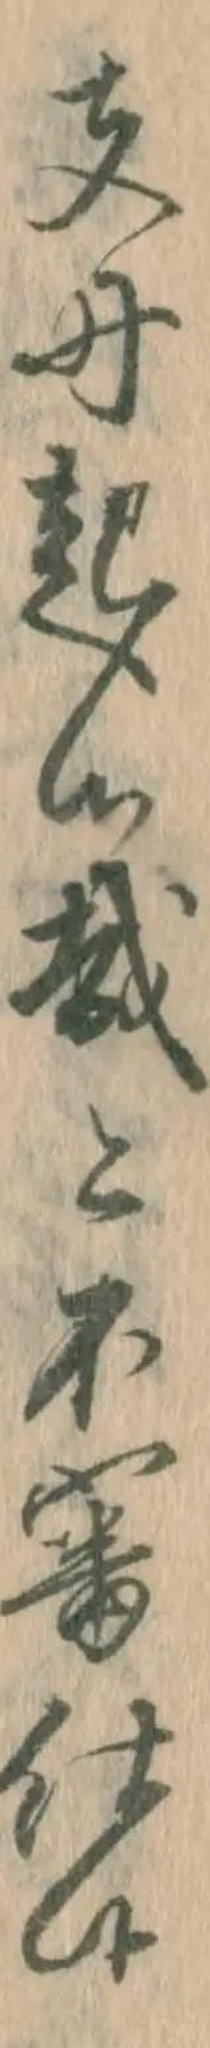支丹起候哉と不審仕候
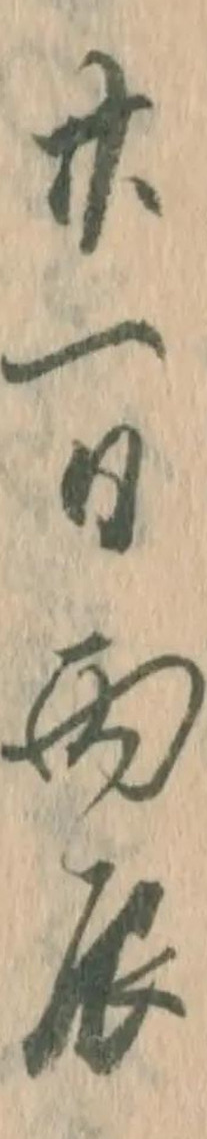廿一日丙辰
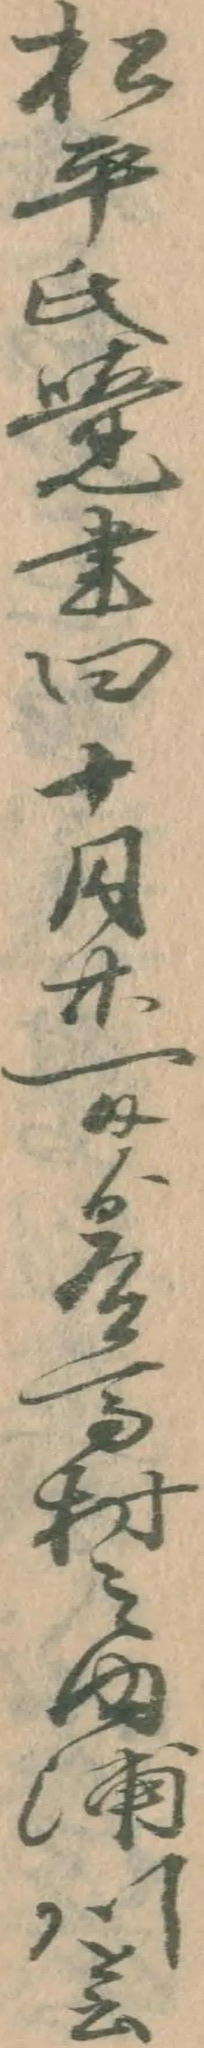松平氏覚書日十月廿一日ゟ有馬村之内浦川と云
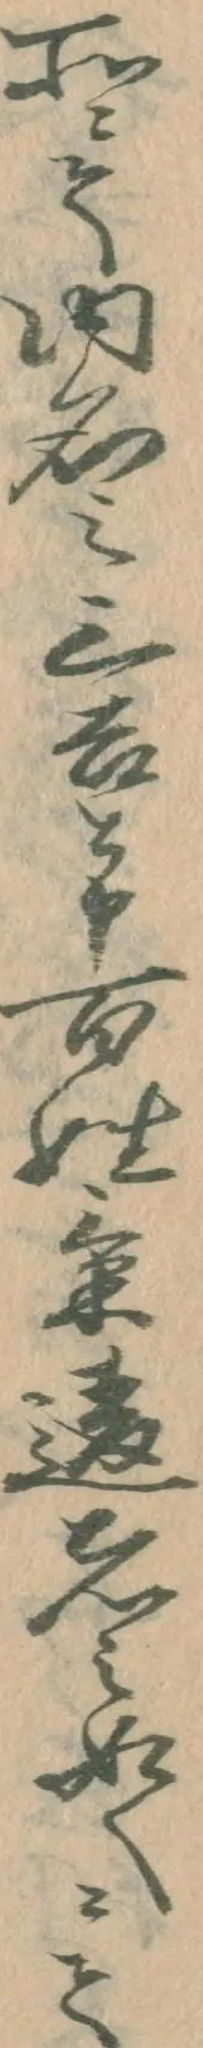所にて内名之三吉と申百姓気違者之如くにて
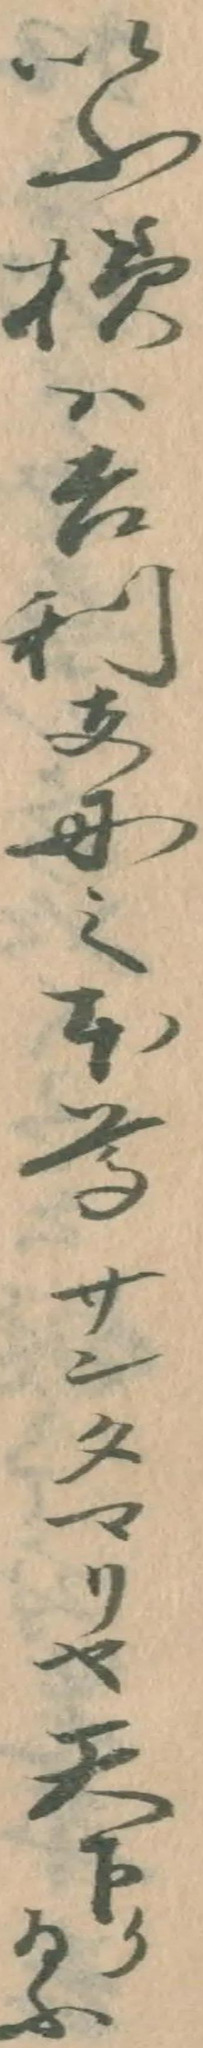いふ様は吉利支丹之本尊サンタマリヤ天下り給ふ

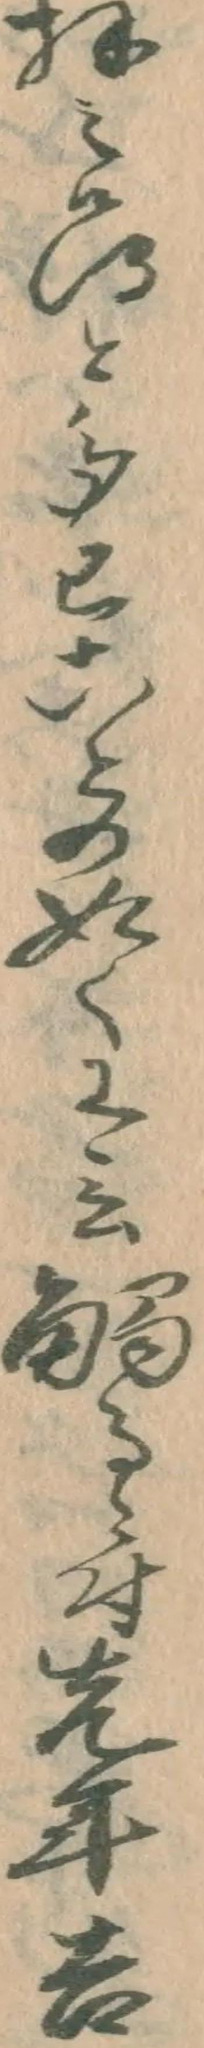拝之候得とたいことの如くに云触るに付先年吉
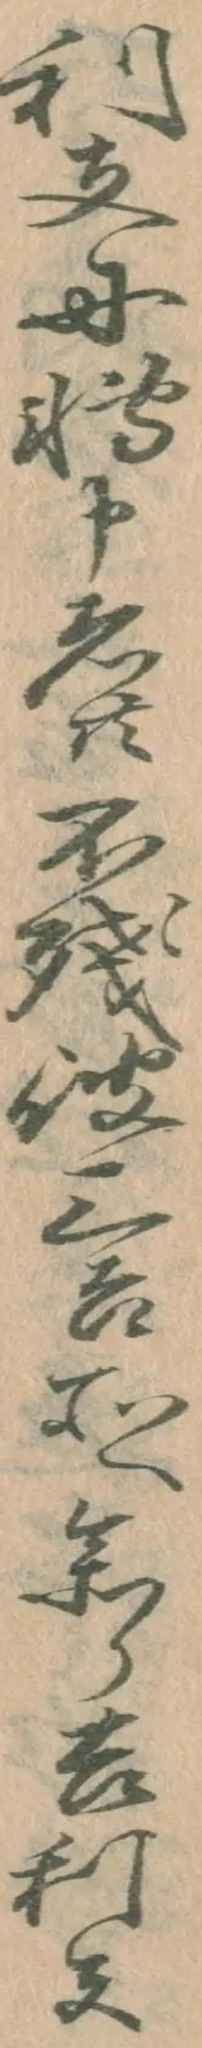利支丹転申者共不残彼三吉所へ参り吉利支
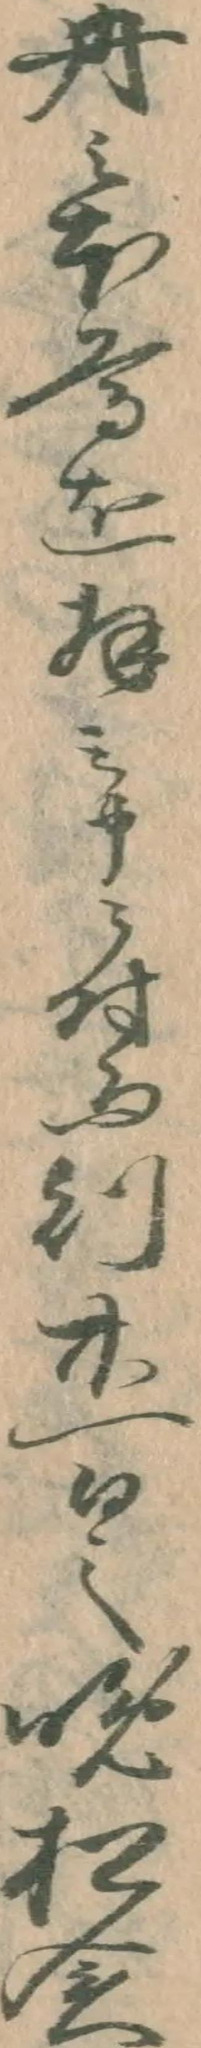丹之本尊を拝み申に付而則廿一日之晩松倉
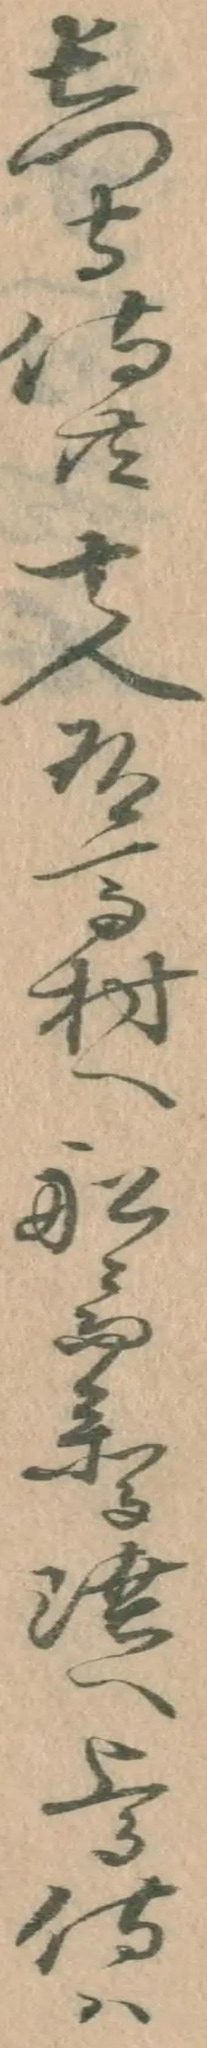長門守侍共十人有馬村へ船に而参る陸へ上る侍は
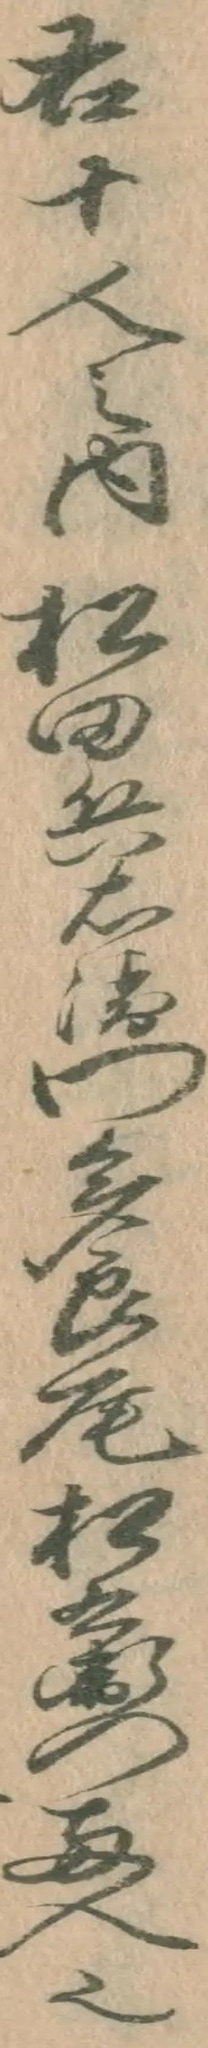右十人之内松田兵右衛門多良尾松兵衛の両人也
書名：切支丹御退治記 49巻. [1]
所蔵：国立国会図書館 National Diet Library, JAPAN
